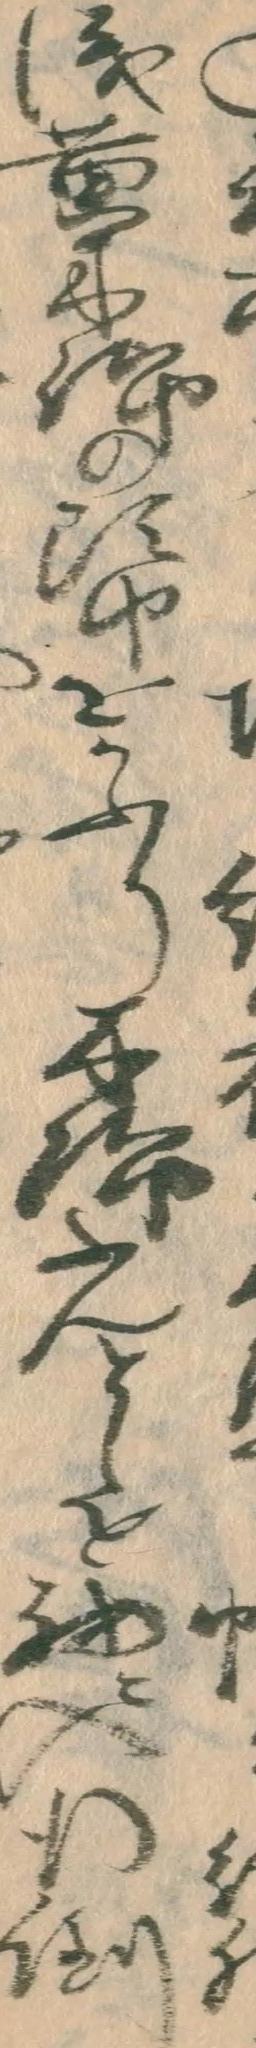浅黄木綿の頭巾をかふり木綿ふんとしを袖に入行倒
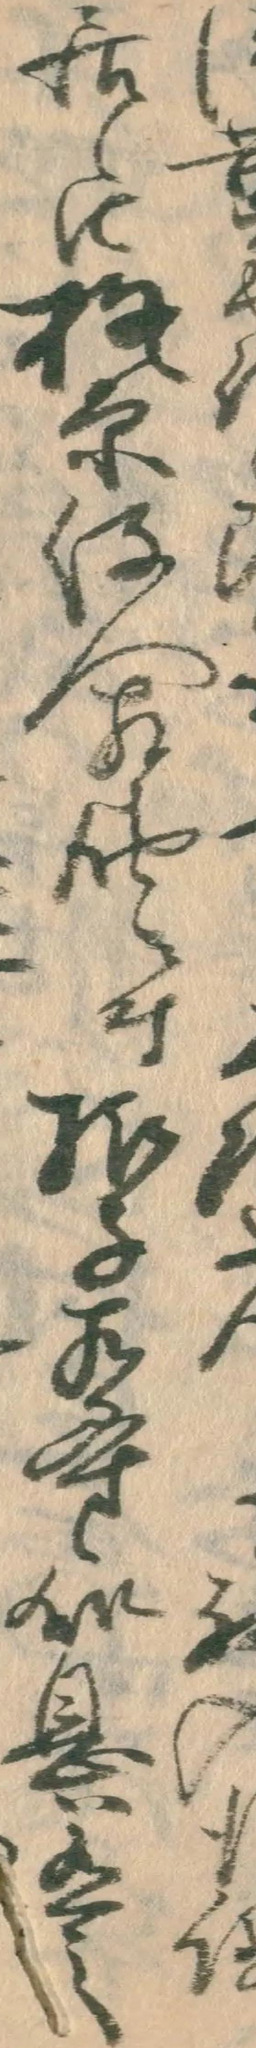居候由柊原役人相届候ニ付様子相尋候処息ハ有之
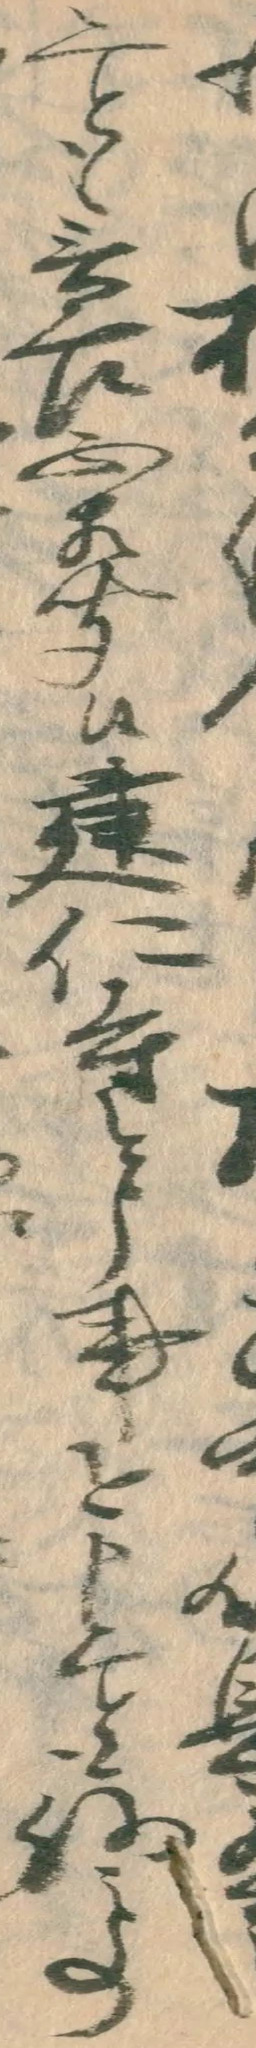候へとも言舌不相聞候建仁寺と申事を申上とも何之事
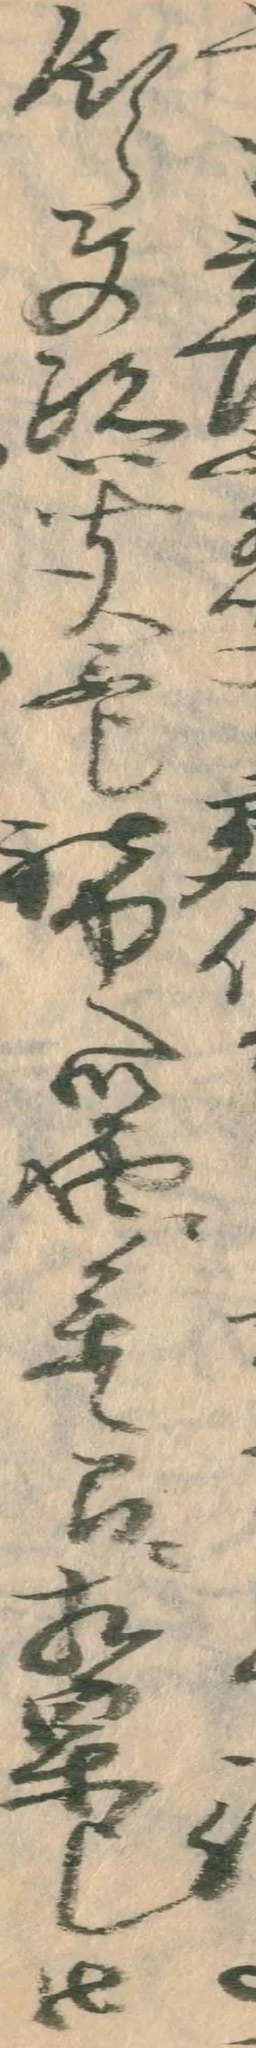やらその跡ハ聞へ不申候社中へ御届参候間に相果申候由
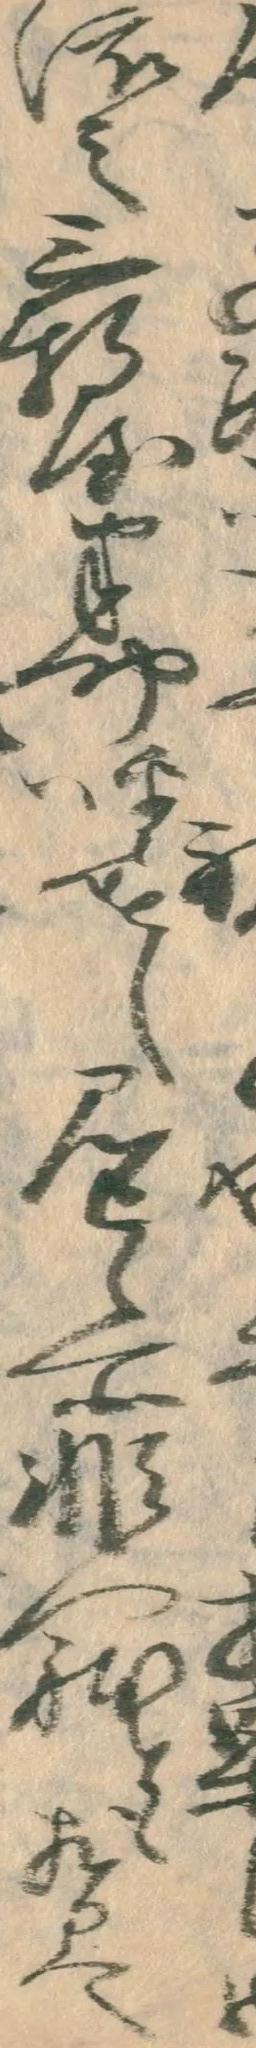依之三枚屋半助呼出し見セ候所非人体とも相見へ
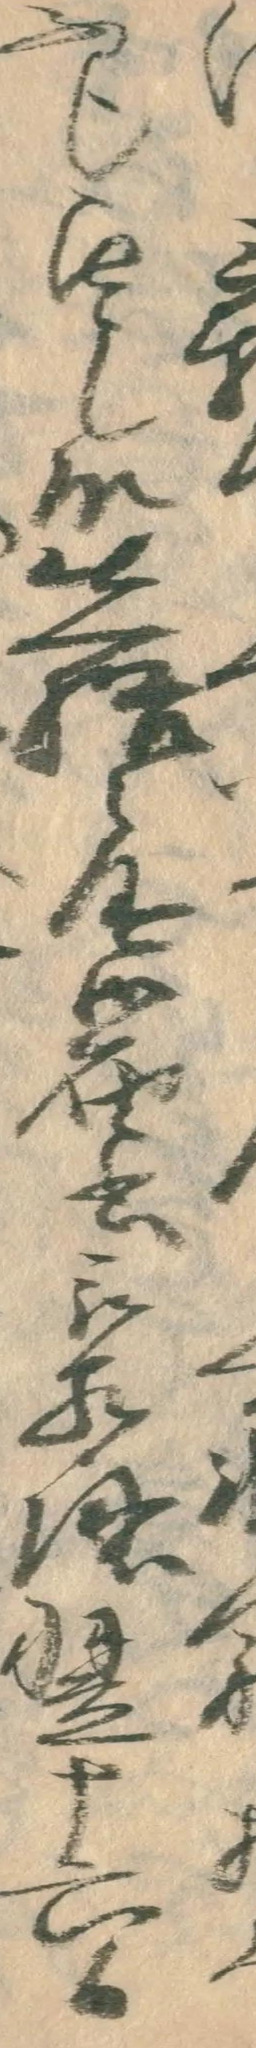不申候故先格之通御届書被相認翌十六日
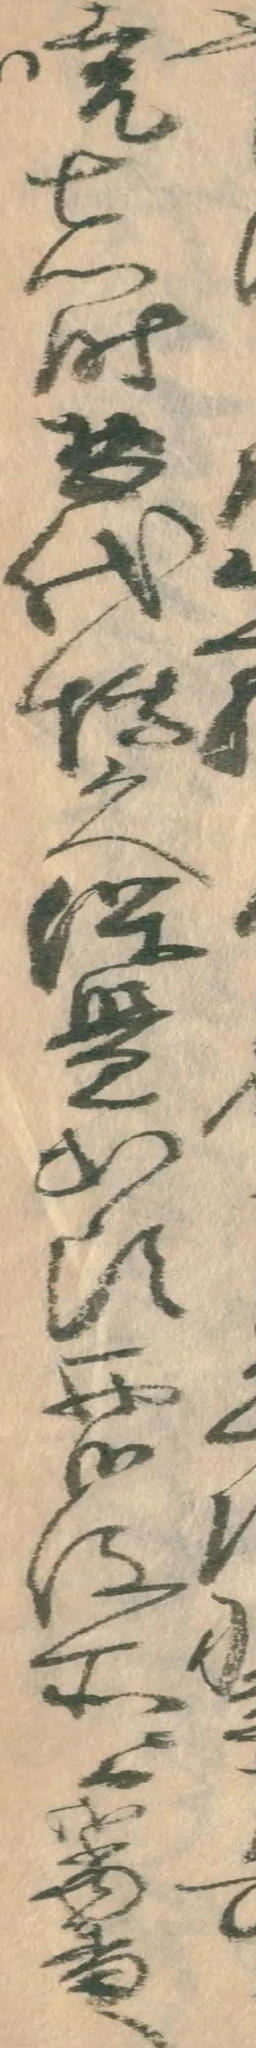暁七ツ時惣代博久保覚出頭西御役所ニ而御当番へ

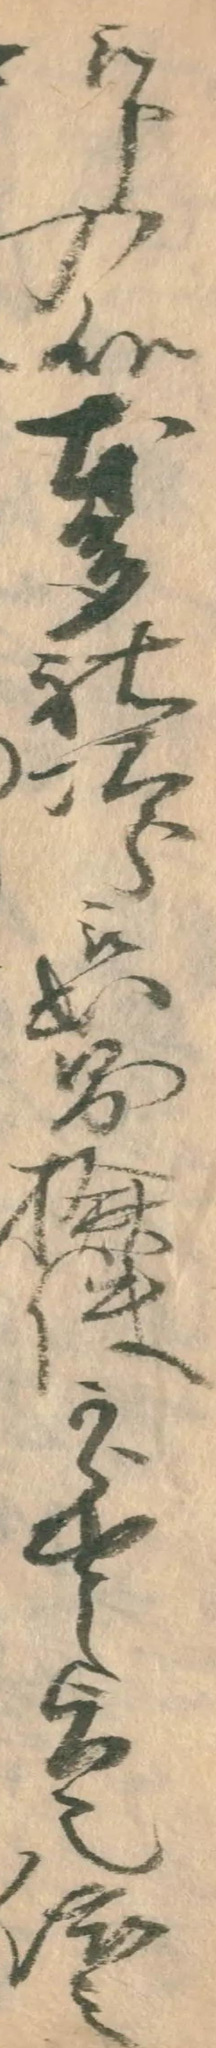被申入処本多祐次郎被出則検使可被出之旨也依之
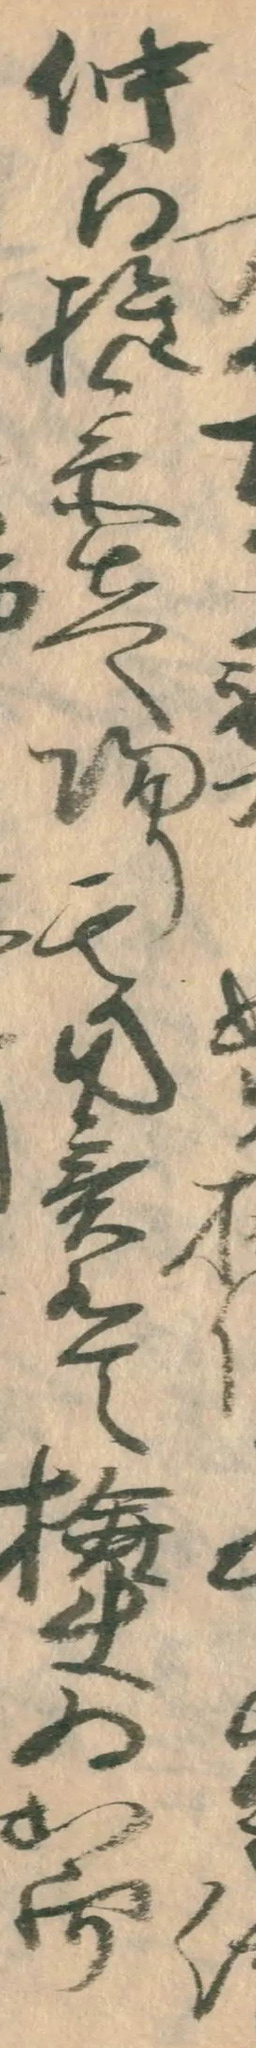仲間権兵衛先へ帰り其用意有之検使為出向
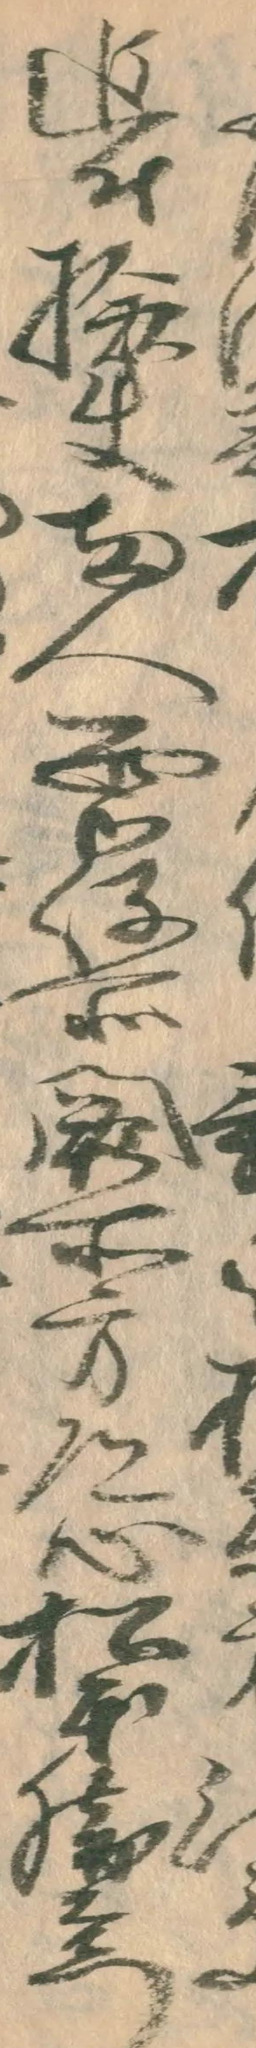追付検使両人西御役所闕所方道心松本勝右衛門
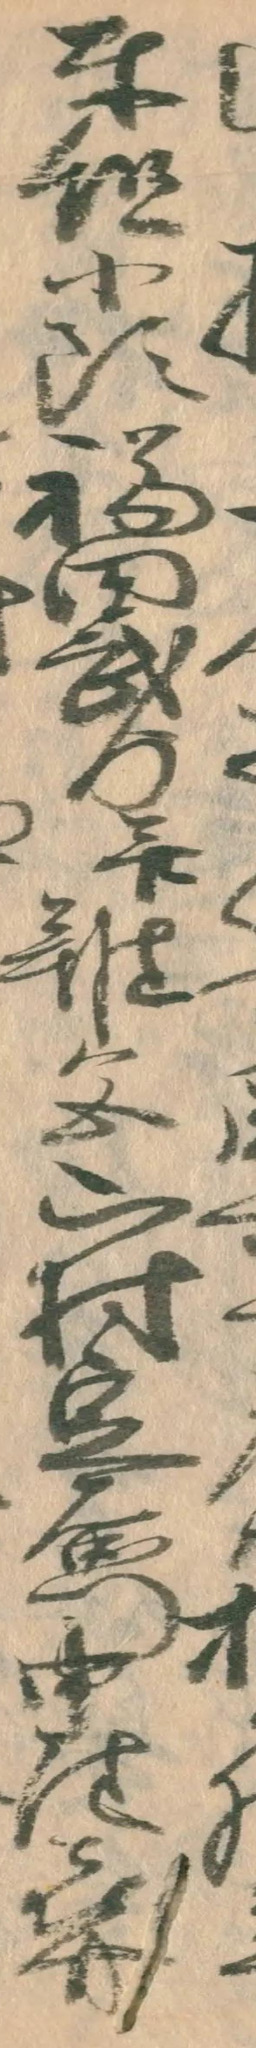東組小頭福田武右衛門并雑色山村定右衛門中座喜介
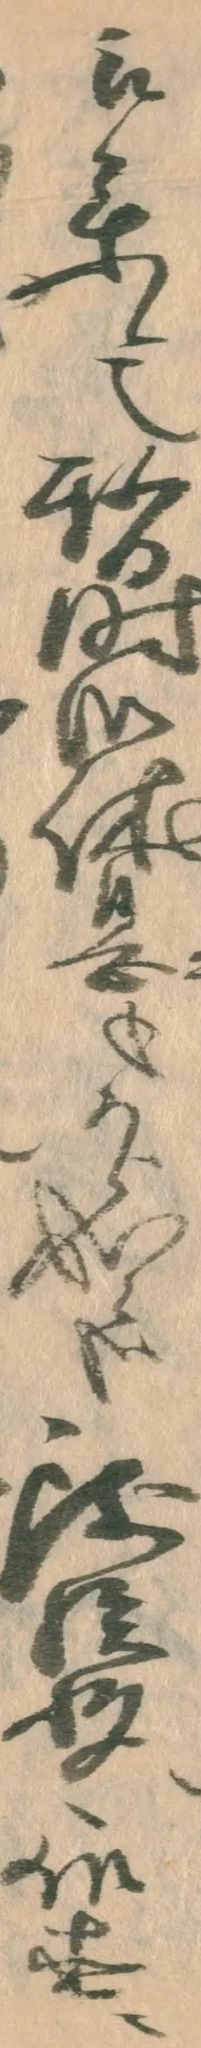被参候也暫時御休息も可被成候哉致挨拶候処直ニ
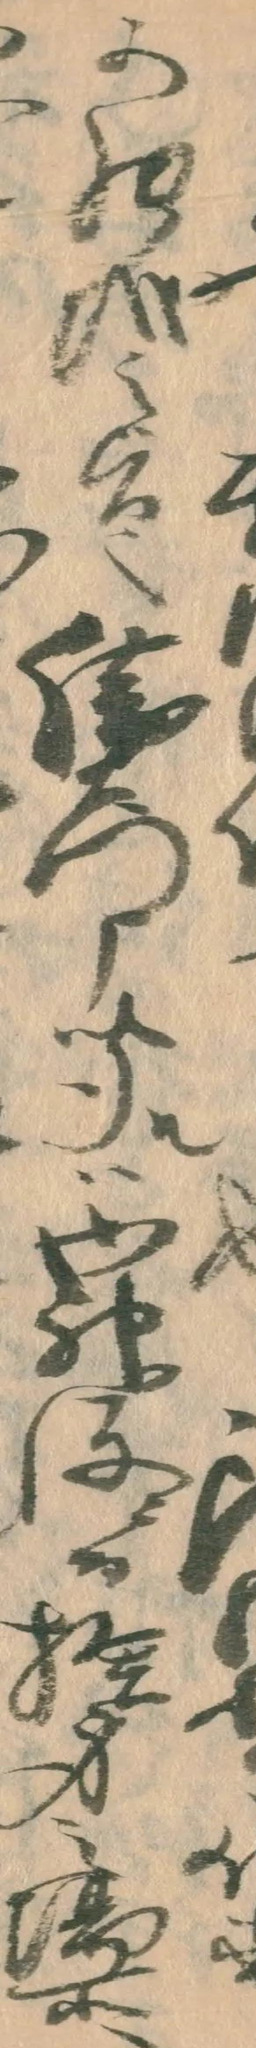可罷越之旨也勝右衛門申聞ルハ御神役ニ而捨身之場所へ
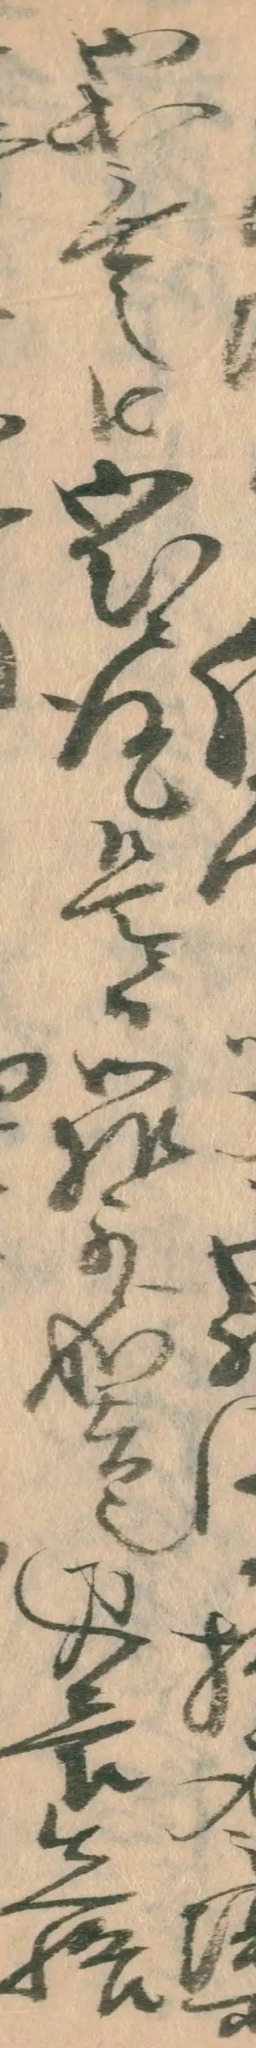御出無之由御尤ニ存候是ニ而御扣可被成旨也返答先格
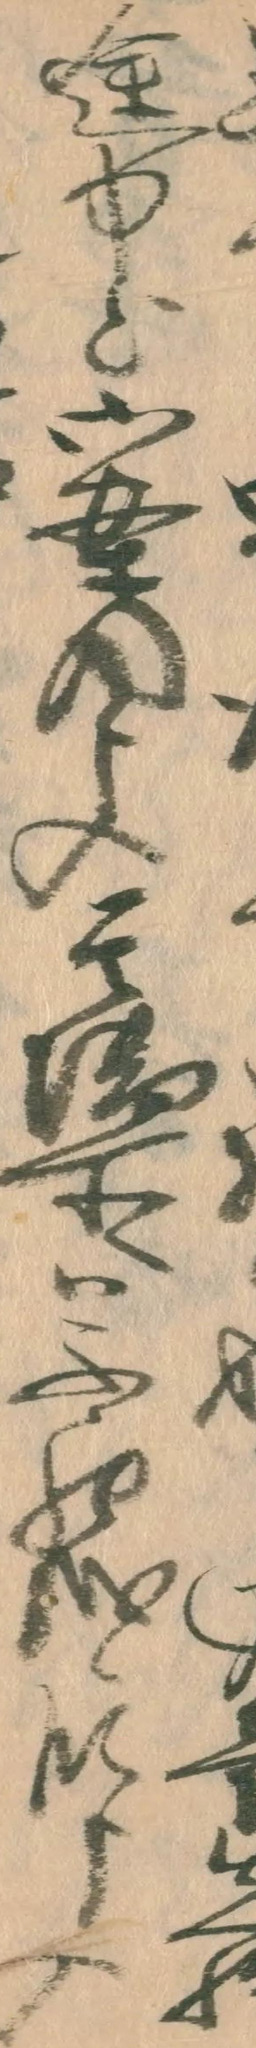途中迄御案内申入其場所ヘハ不罷越候段申入
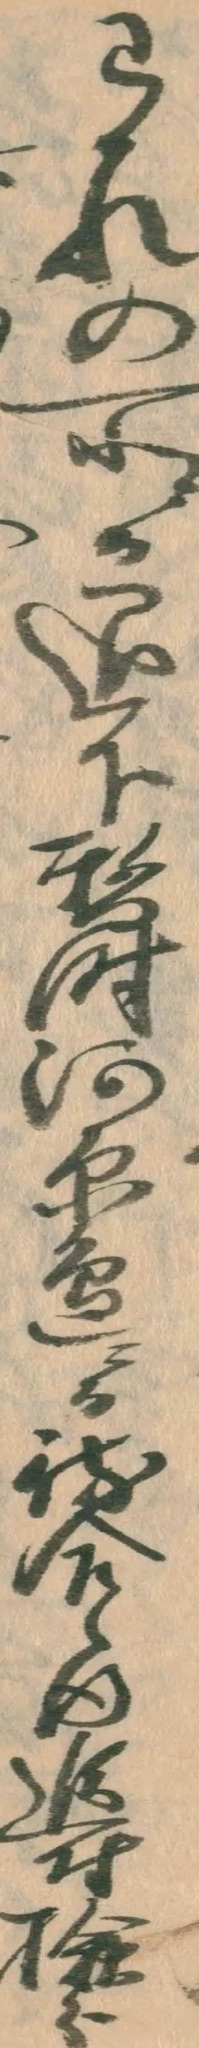わかれの所ニ而退下暫時河原辺ニ而待合候内追付検分
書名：賀茂社記録. 第60冊
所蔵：国立国会図書館 National Diet Library, JAPAN
